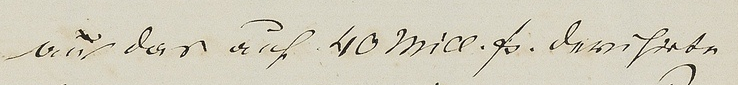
an das auf 40 Mill. F. devisirte
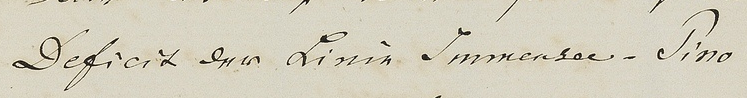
Deficit der Linie Immensee –Pino
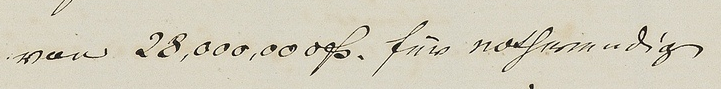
von 28,000,000 Fs. für nothwendig
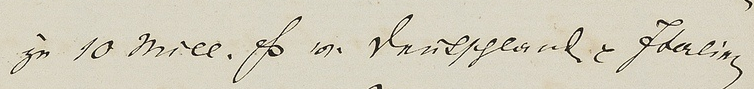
je 10 Mill. F. v. Deutschland & Italien
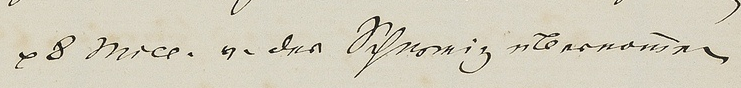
& 8 Mill. v. der Schweiz übernommen
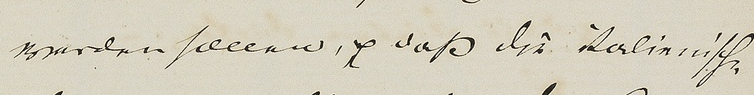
werden sollen, & daß die italienische
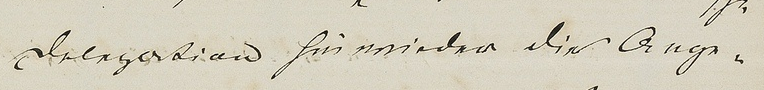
Delegation hinwieder die Ange-
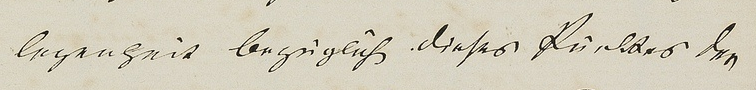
legenheit bezüglich dieses Punktes der
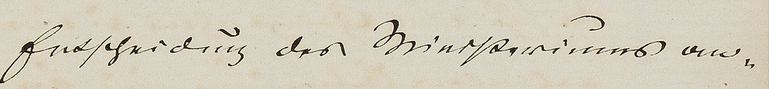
Entscheidung des Ministeriums an-
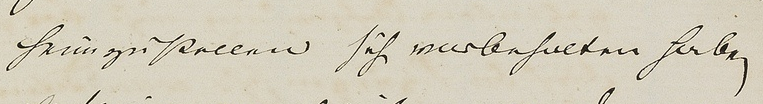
heimzustellen sich vorbehalten habe.
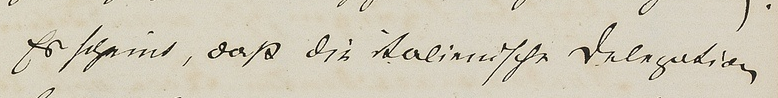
Es scheint, daß die italienische Delegation
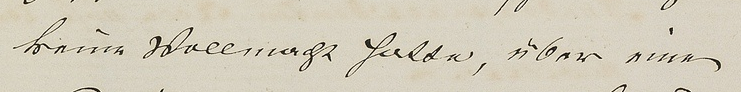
keine Vollmacht hatte, über eine
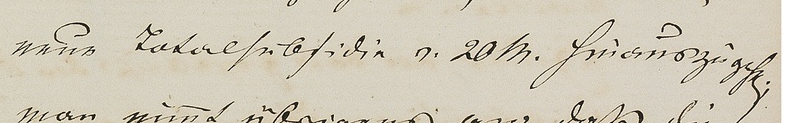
neue Totalsubsidie v. 20 M. hinauszugehen;
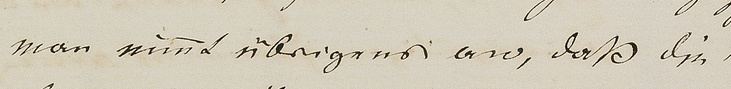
man nimmt übrigens an, daß die
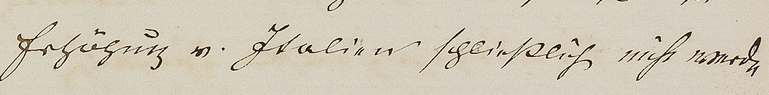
Erhöhung v. Italien schließlich nicht werde
